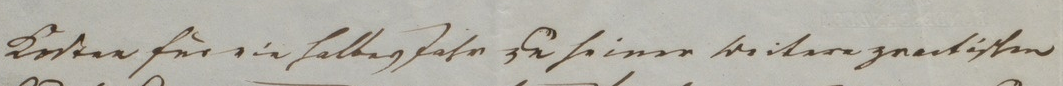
Kosten für ein halbes Jahr zu seiner weitern practischen
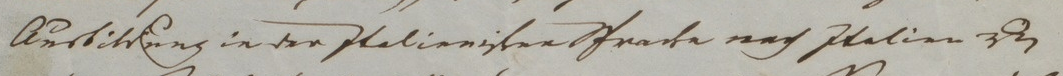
Ausbildung in der Italienischen Sprache nach Italien zu
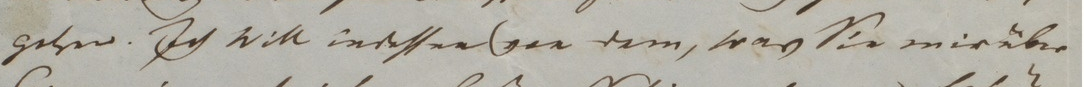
gehen. Ich will indessen von dem, was Sie mir über
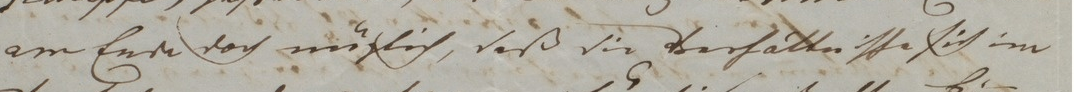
am Ende doch möglich, daß die Verhältnisse sich im
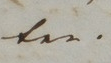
ten.
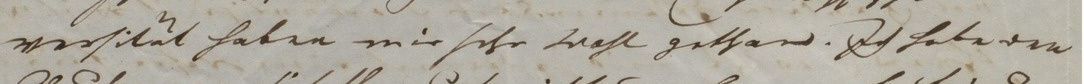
versität haben mir sehr wohl gethan. Ich habe den
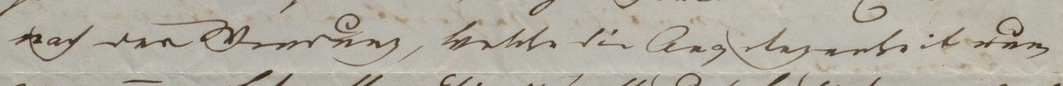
nach der Wendung, welche die Angelegenheit nun
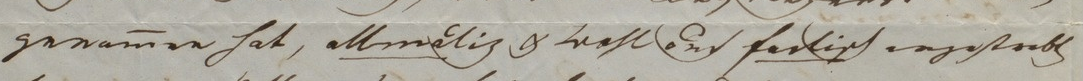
genommen hat, allmälig & wohl auch factisch angestrebt
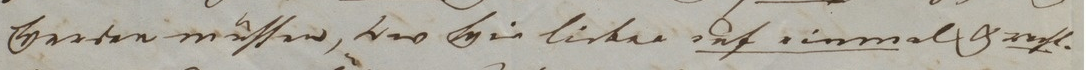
werden müssen, was wir lieber auf einmal & recht-
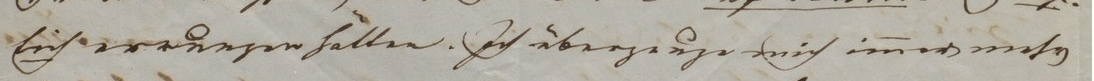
lich errungen hätten. Ich überzeuge mich immer mehr
